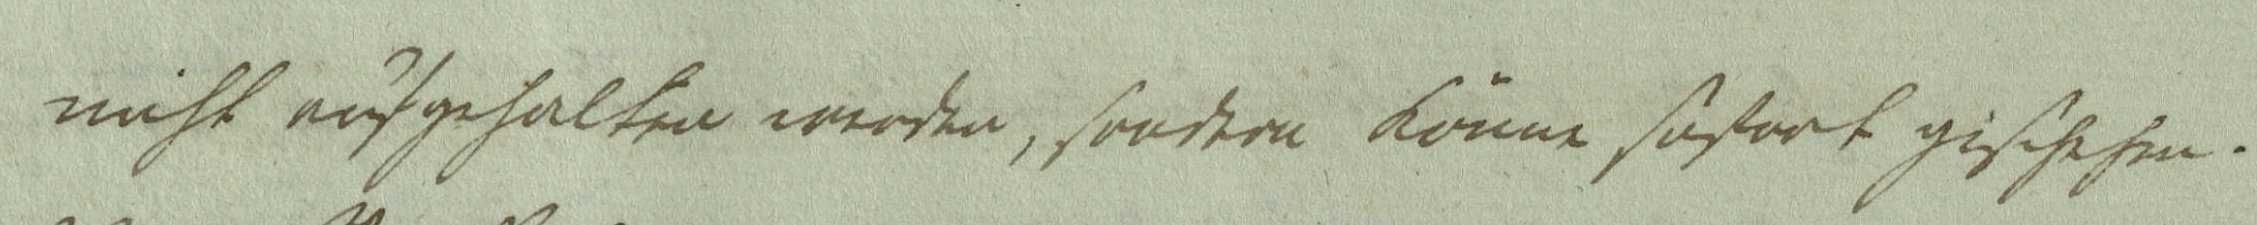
nicht aufgehalten werden, sondern könne sofort geschehen.
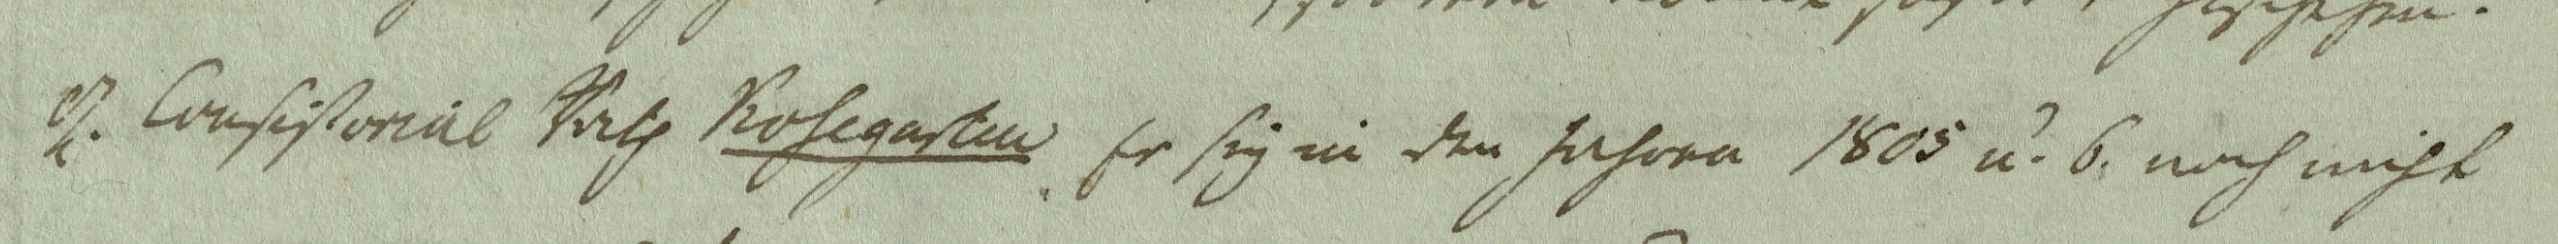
dh. Consistorial Rath Kosegarten Er seÿ in den Jahren 1805 u. 6. noch nicht
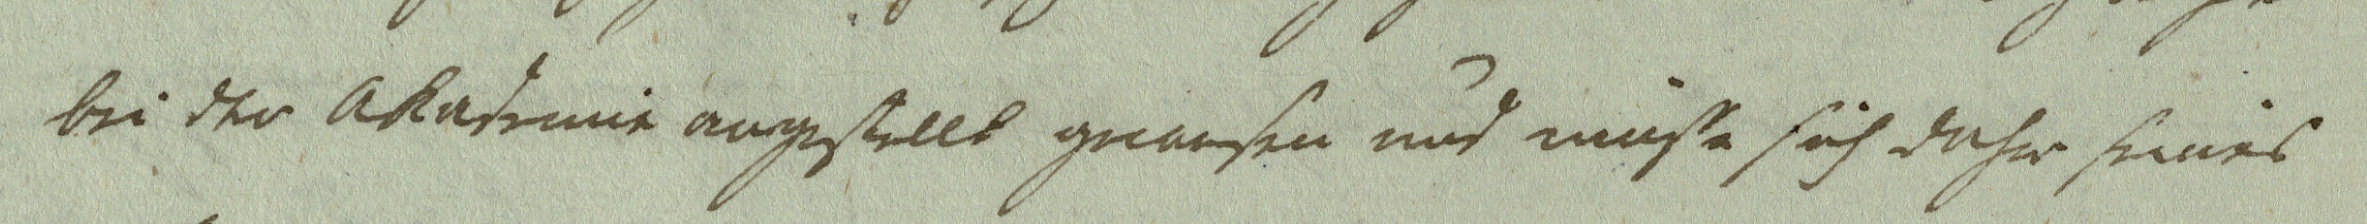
bei der Akademie angestellt gewesen und müsse sich daher seines
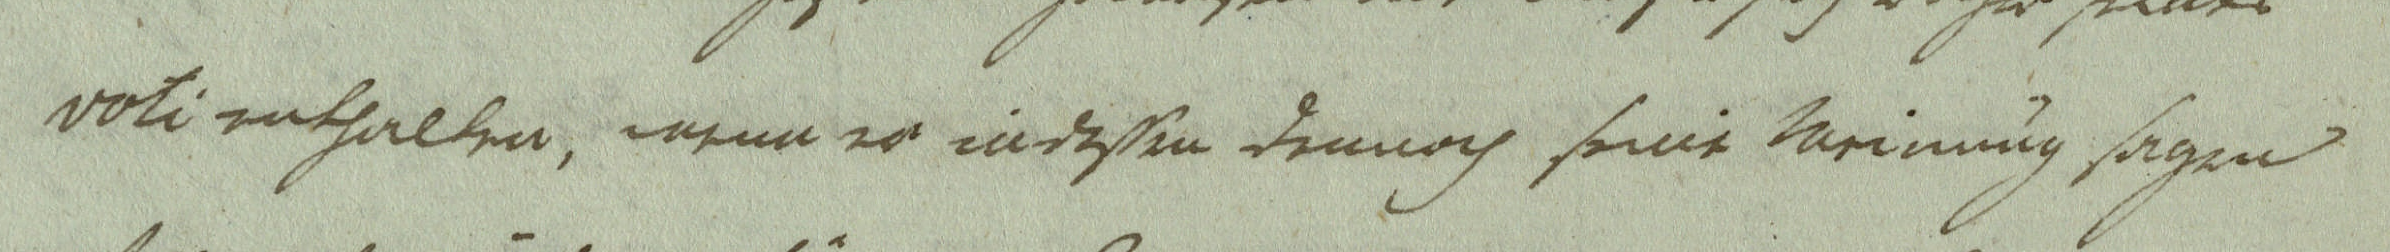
voti enthalten, wenn er indessen dennoch seine Meinung sagen
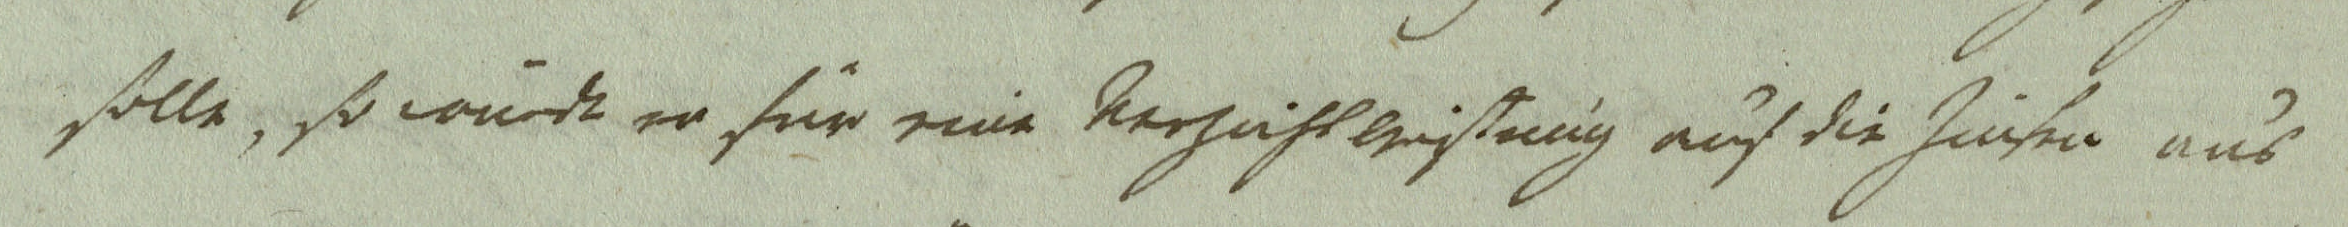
solle, so würde er für eine Verzichtleistung auf die Zinsen aus
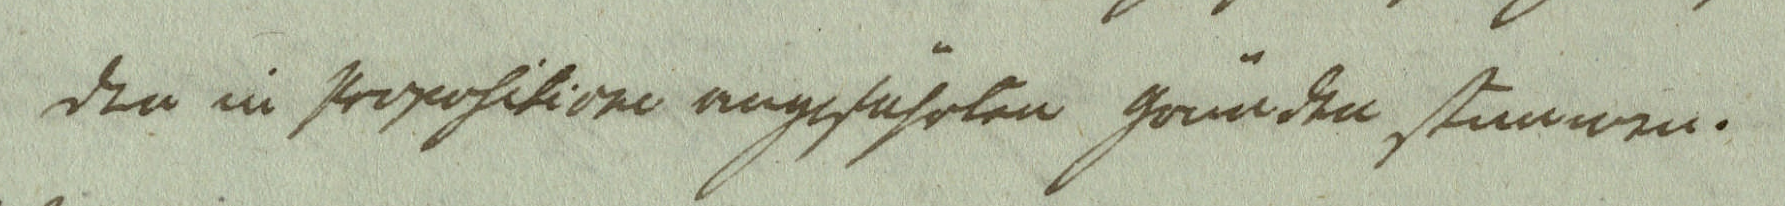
den in Propositione angeführten Gründen stimmen.
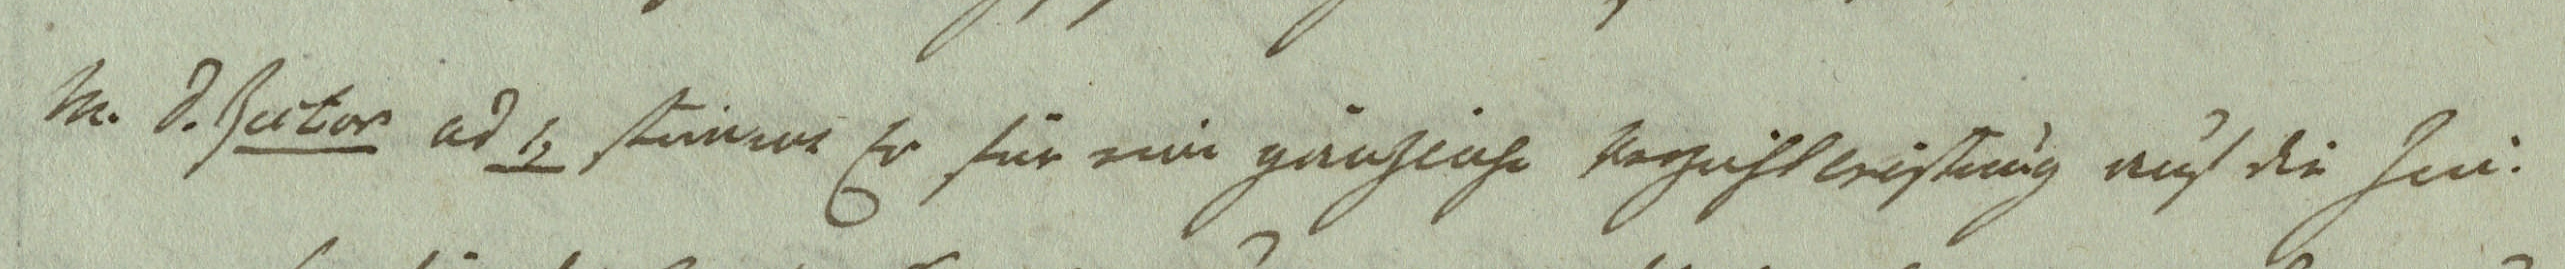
M. D. Rector ad 1, stimme Er für eine gänzliche Verzichtleistung auf die Zin¬
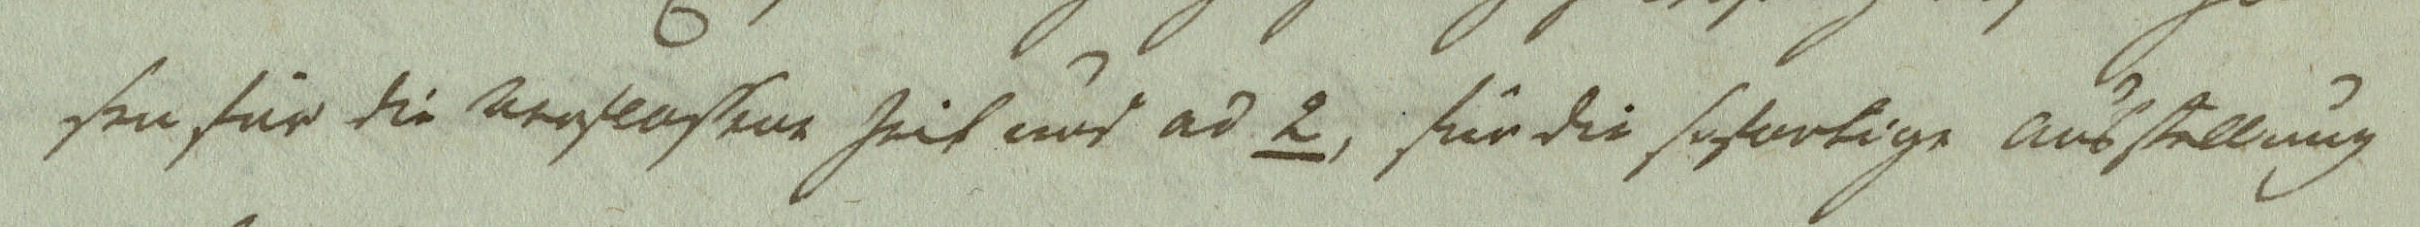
sen für die verflossene Zeit und ad 2, für die sofortige Ausstellung
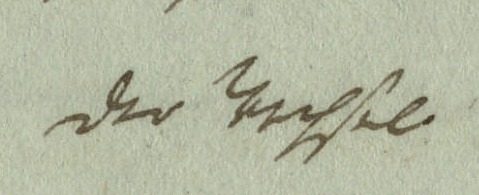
der Wechsel.
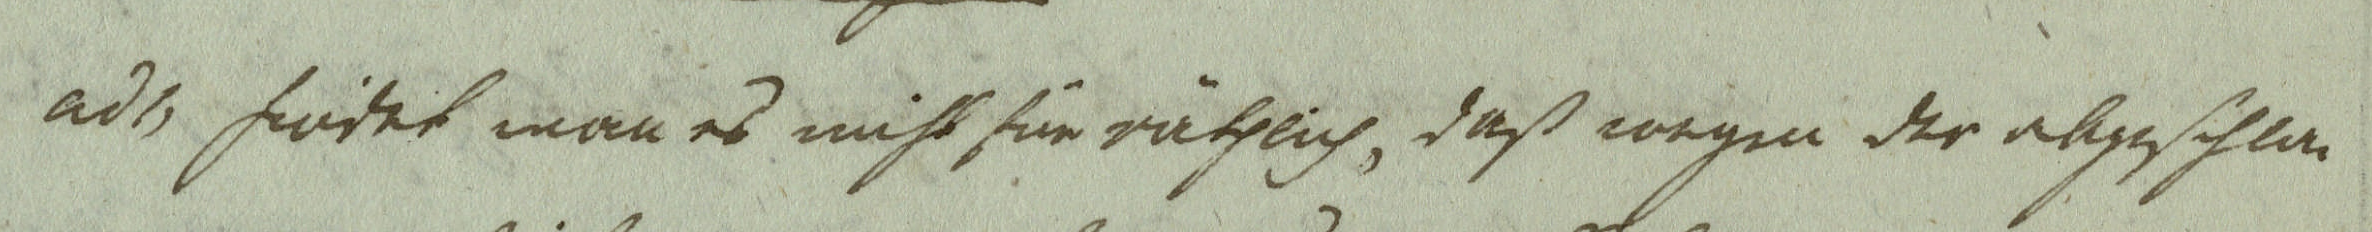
ad 1, findet man es nicht für räthlich, daß wegen der abgeschla¬
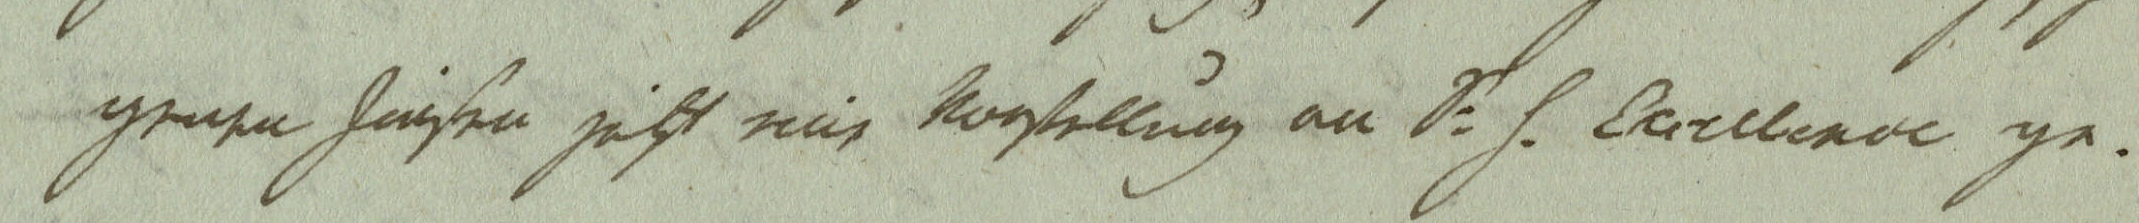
genen Zinsen jetzt eine Vorstellung an Sr. h. Excellence ge¬
